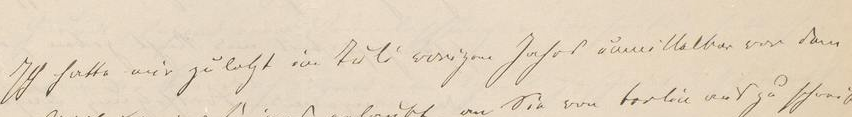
Ich hatte mir zuletzt im Juli vorigen Jahres unmittelbar vor dem
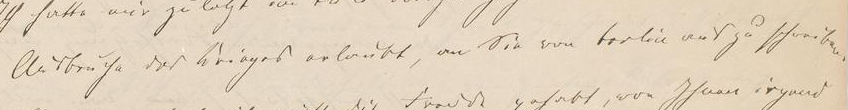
Ausbruche des Krieges erlaubt, an Sie von Berlin aus zu schreiben.
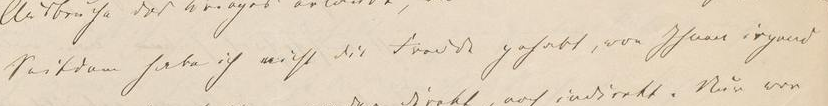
Seitdem habe ich nicht die Freude gehabt, von Ihnen irgend
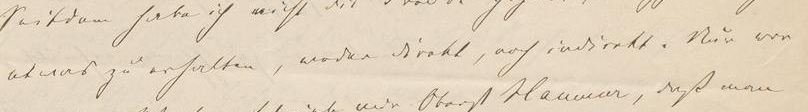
etwas zu erhalten, weder direkt, noch indirekt. Nur vor
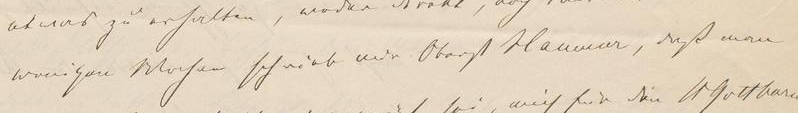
wenigen Wochen schrieb mir Oberst Hammer, daß man
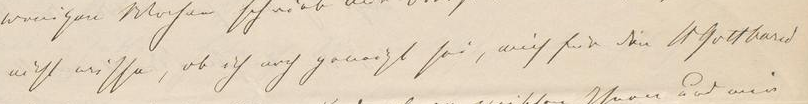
nicht wisse, ob ich noch geneigt sei, mich für die St Gotthard -
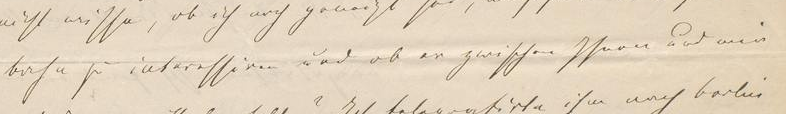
bahn zu interessiren und ob er zwischen Ihnen und mir
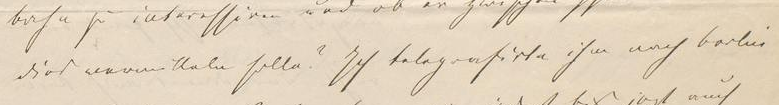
dies vermitteln solle? Ich telegrafirte ihm nach Berlin
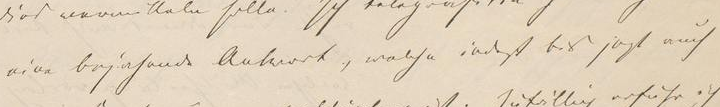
eine bejahende Antwort, welche indeß bis jezt auch
